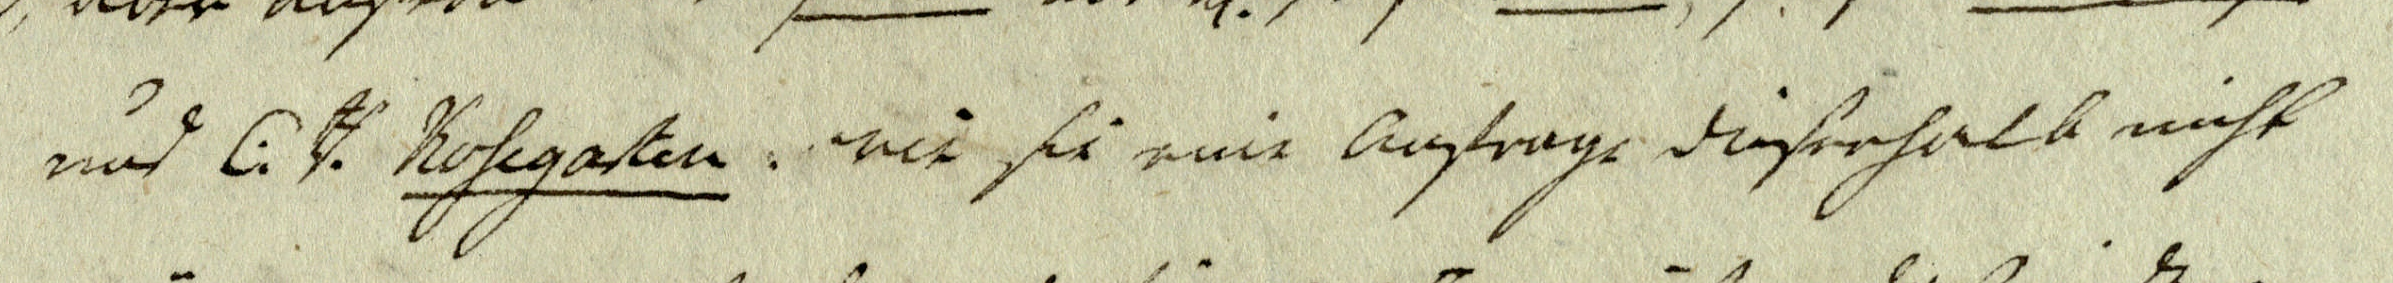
und C. R. Kosegarten. wie sie eine Anfrage dieserhalb nicht
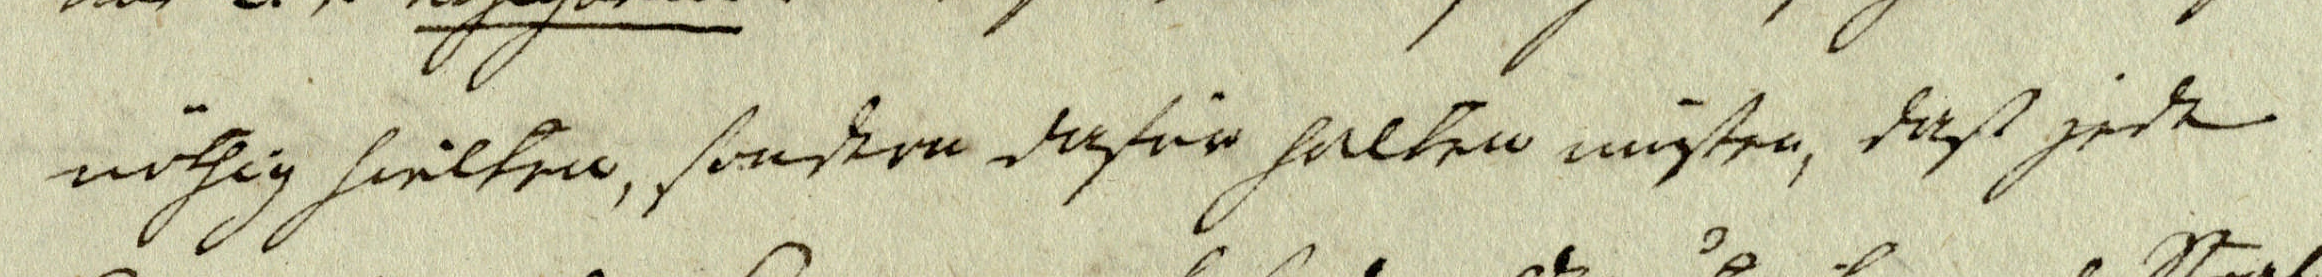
nöthig hielten, sondern dafür halten müsten, daß jede
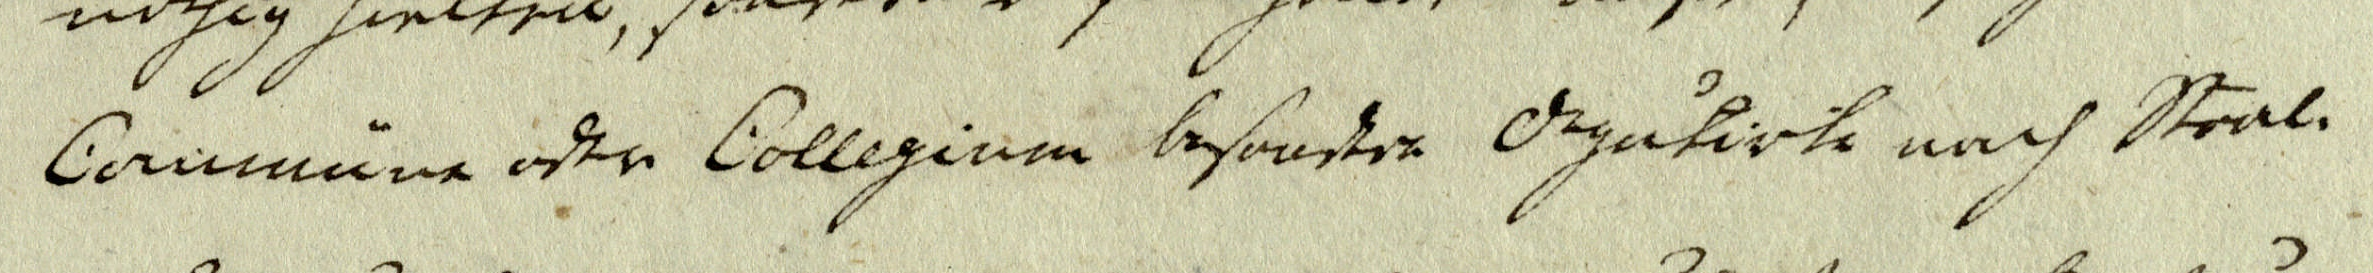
Commüne oder Collegium besondere Deputirte nach Stral¬
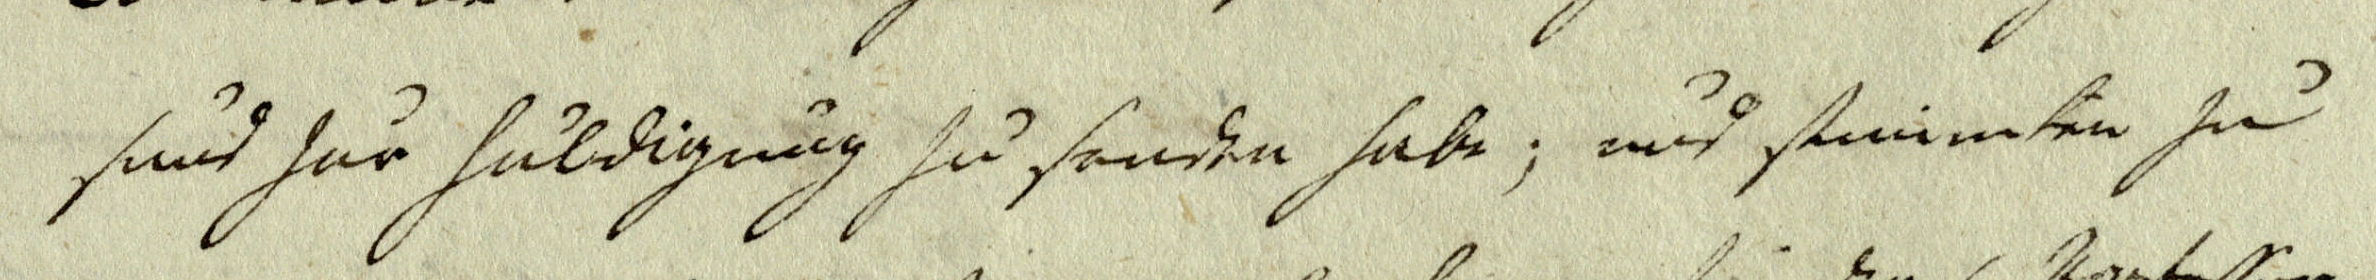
sind zur Huldigung zu senden habe; und stimmten zu
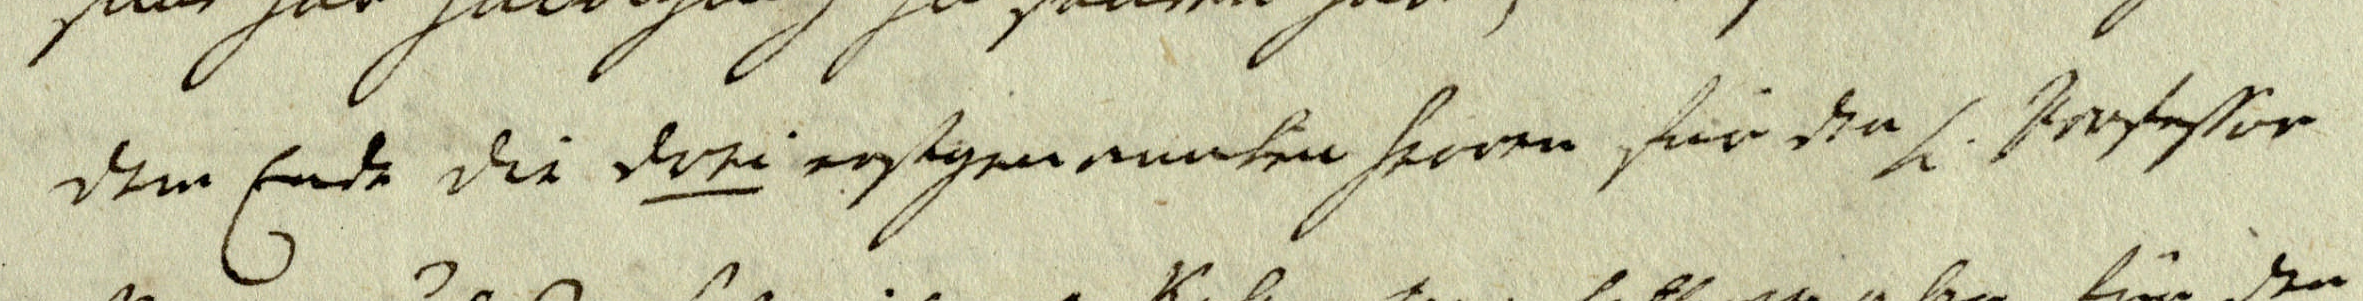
dem Ende die drei erstgenannten Herren für den H. Professor
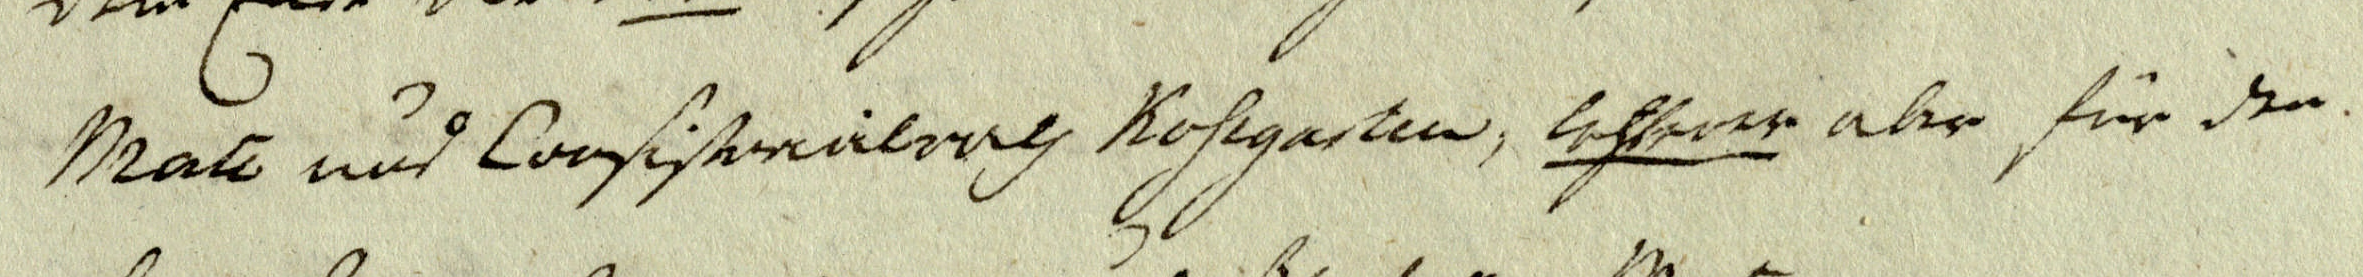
Bratt und Consistorialrath Kosegarten, letzterer aber für den
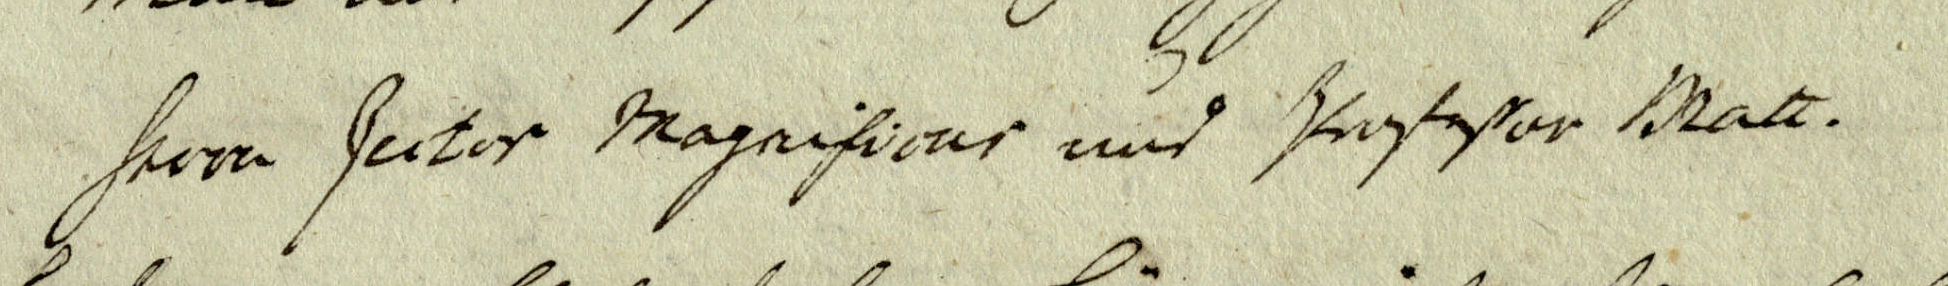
Herrn Rector Magnificus und Professor Bratt.
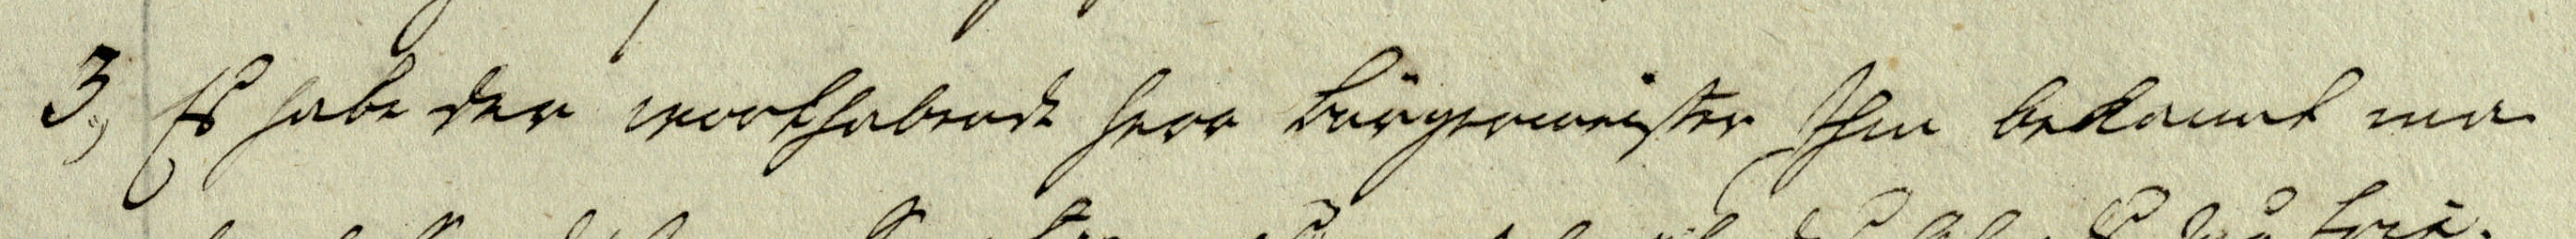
3., Es habe der worthabenden Herr Bürgermeister Ihm bekannt ma¬
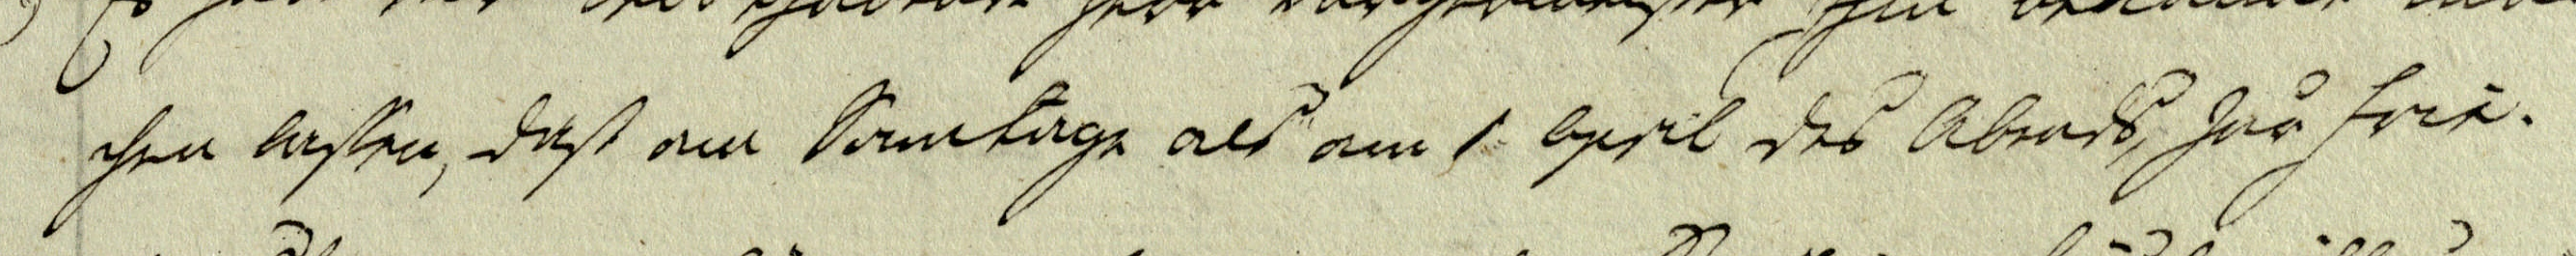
chen lassen, daß am Sonntage als am 1. April des Abends zur Frie¬
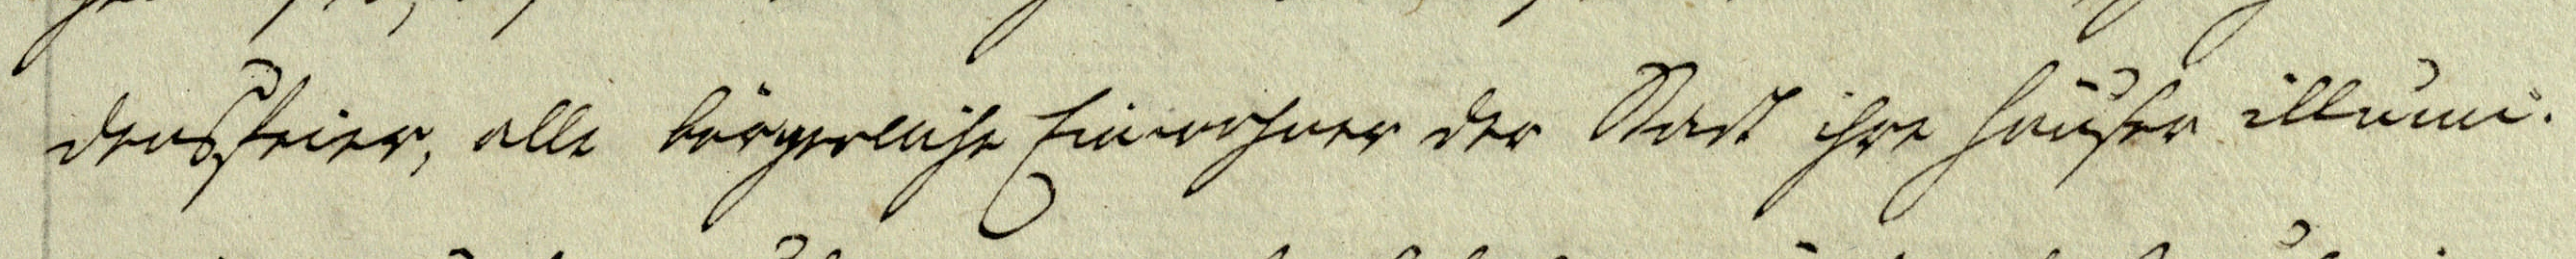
densfeier, alle bürgerlche Einwohner der Stadt ihre Häuser illumi¬
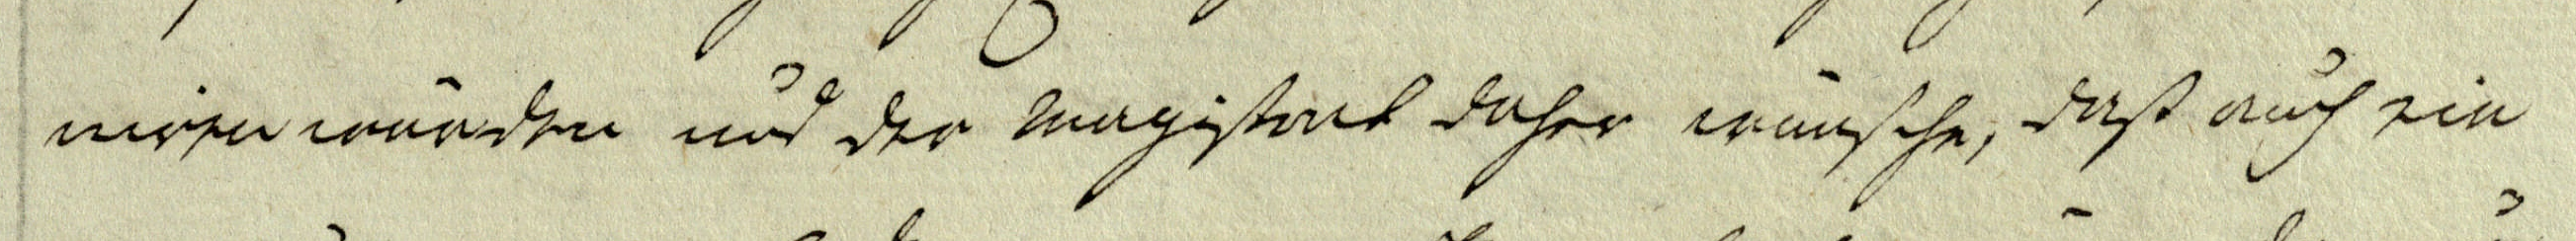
niren würden und der Magistrat daher wünsche, daß auch ein
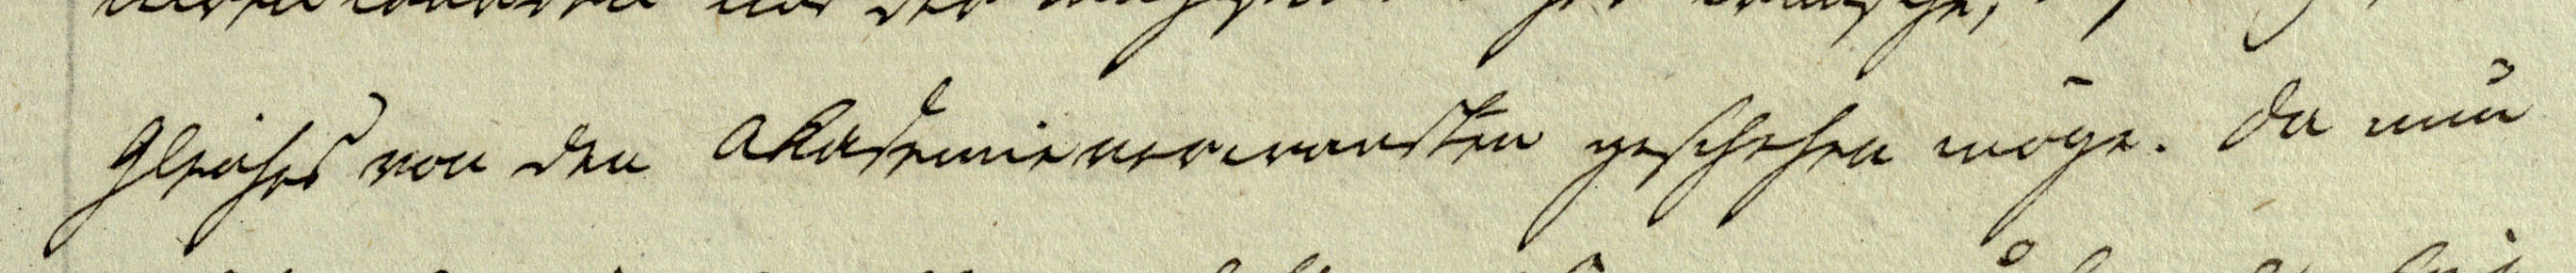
gleiches von den Akademieverwandten geschehen möge. Da nun
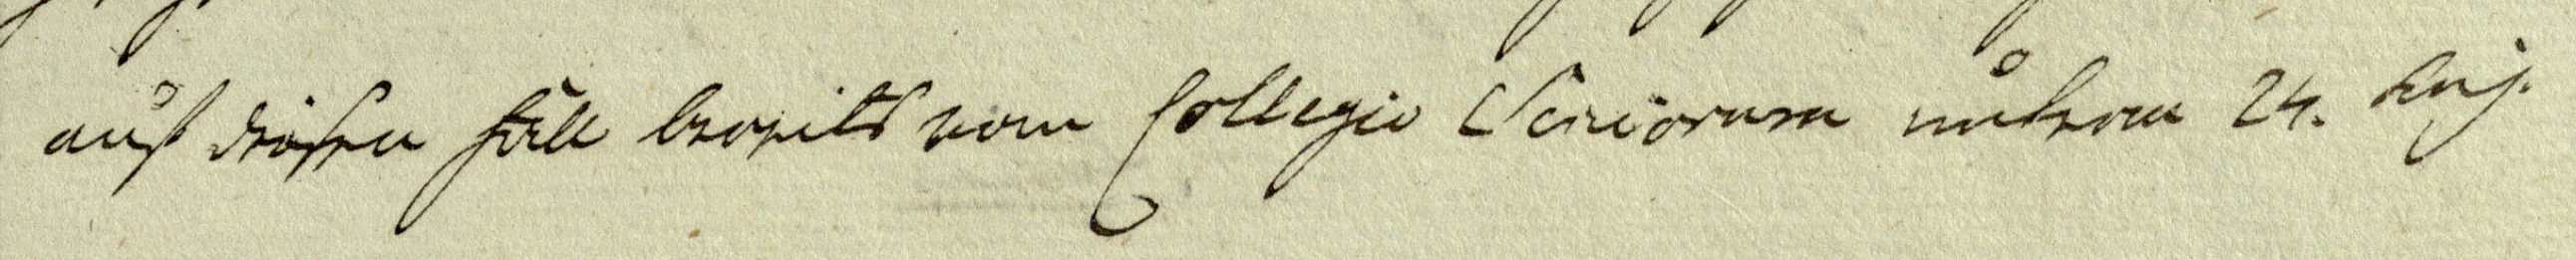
auf diesen Fall bereits vom Collegio Seniorum unterm 24. huj.
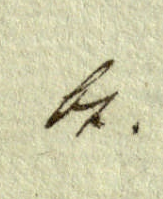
be¬
